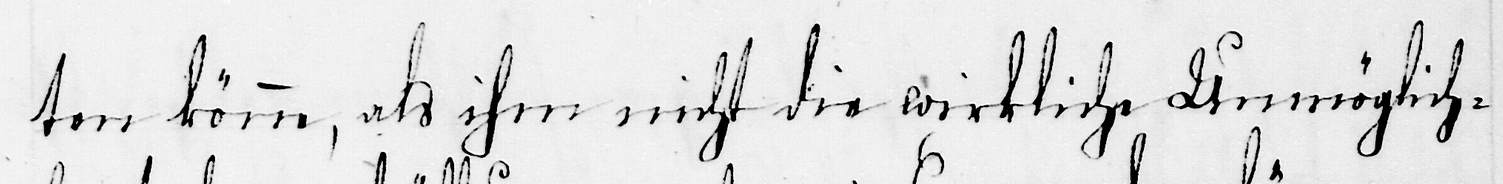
ten könne, als ihm nicht die wirkliche Unmöglich¬
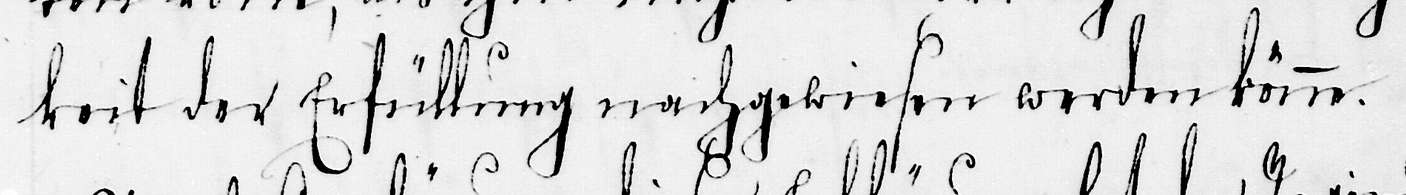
keit der Erfüllung nachgewiesen werden könne.
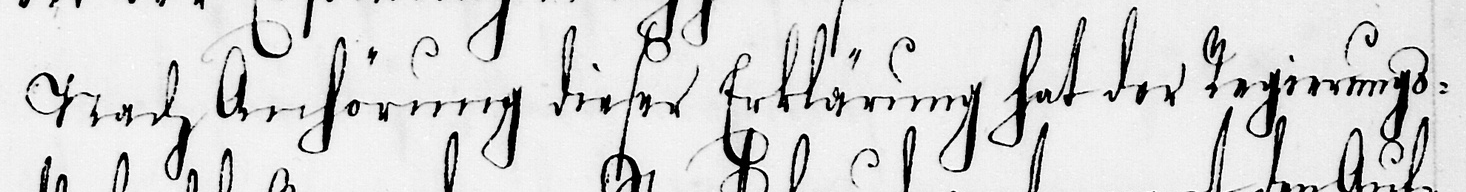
Nach Anhörung dieser Erklärung hat der Regierungs¬
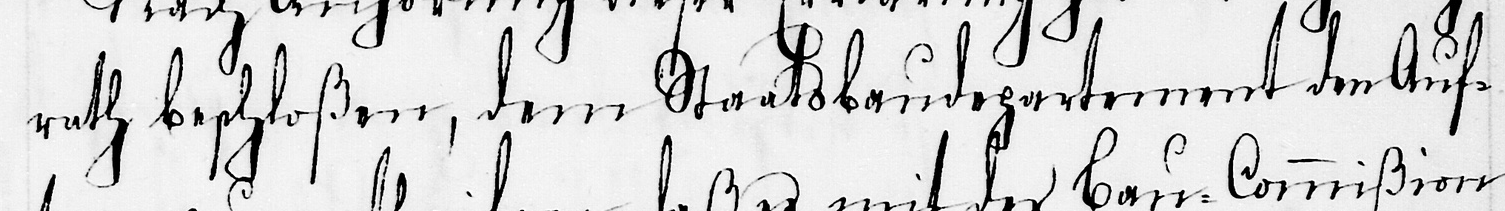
rath beschloßen, dem Staatsbaudepartement den Auf¬
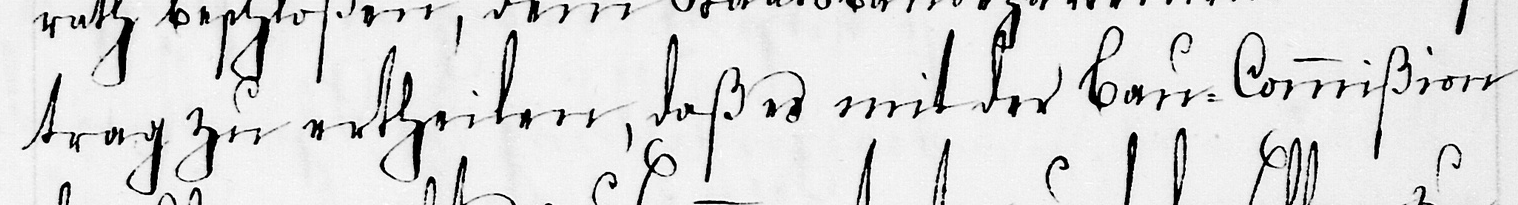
trag zu ertheilen, daß es mit der Bau-Commißion
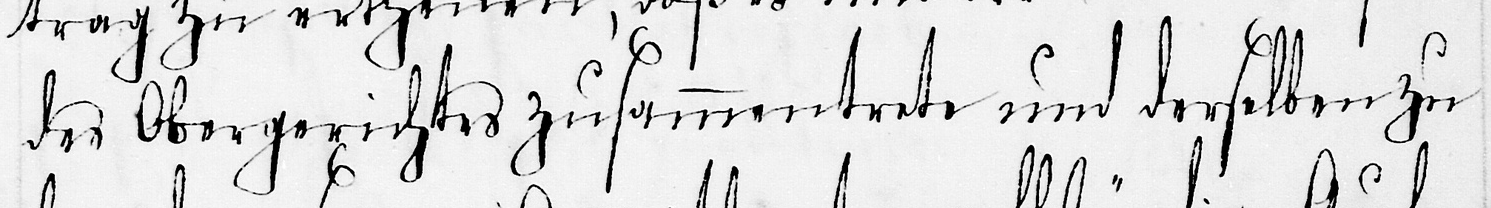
des Obergerichtes zusammentrete und derselben zu
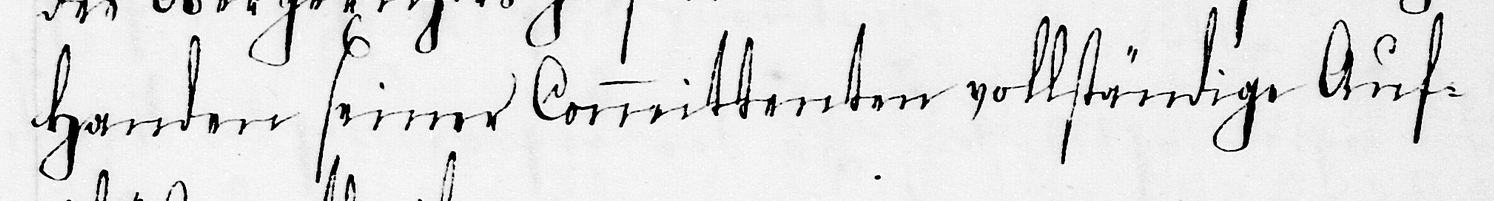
Handen seiner Committenten vollständige Auf¬
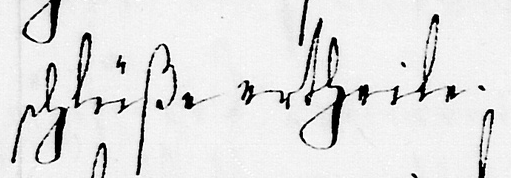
schlüße ertheile.
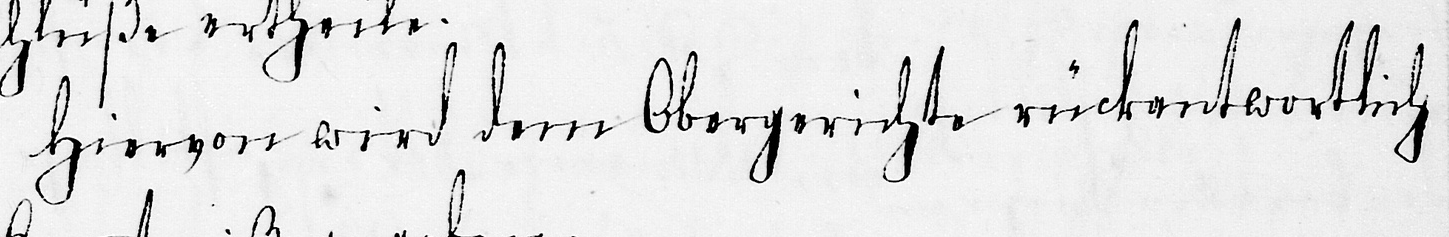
Hiervon wird dem Obergerichte rückantwortlich
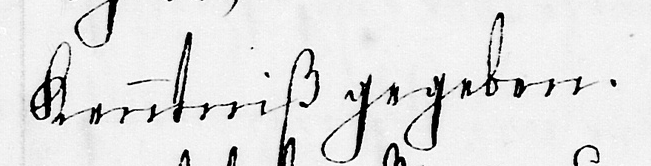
Kenntniß gegeben.
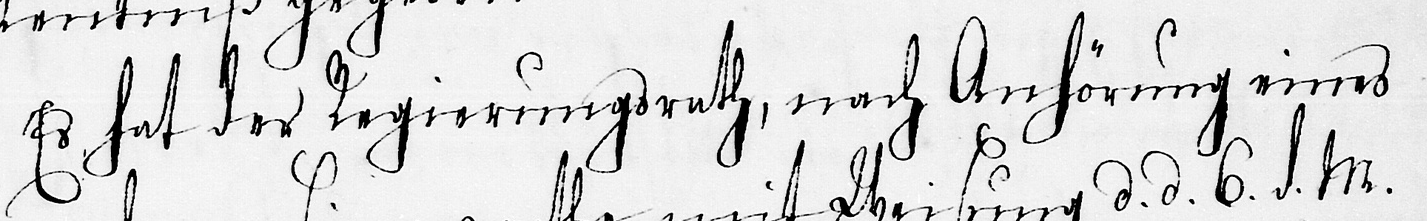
Es hat der Regierungsrath, nach Anhörung eines
